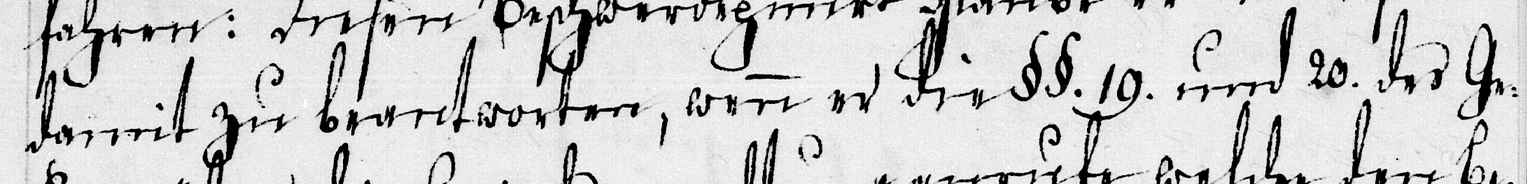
damit zu beantworten, wenn er die §§. 19. und 20. des Ge¬
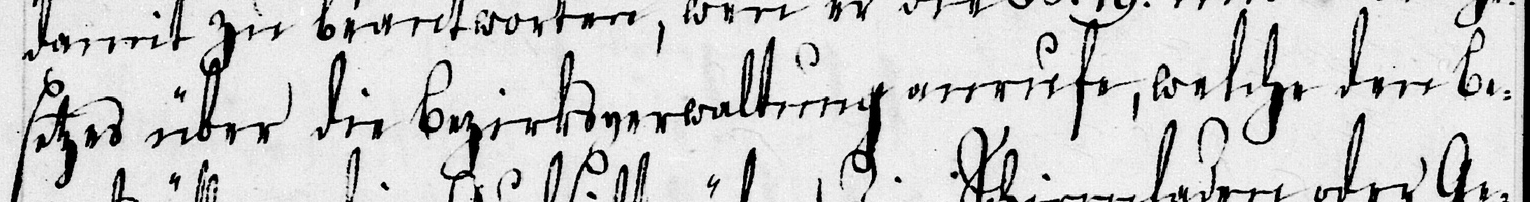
setzes über die Bezirksverwaltung anrufe, welche den Be¬
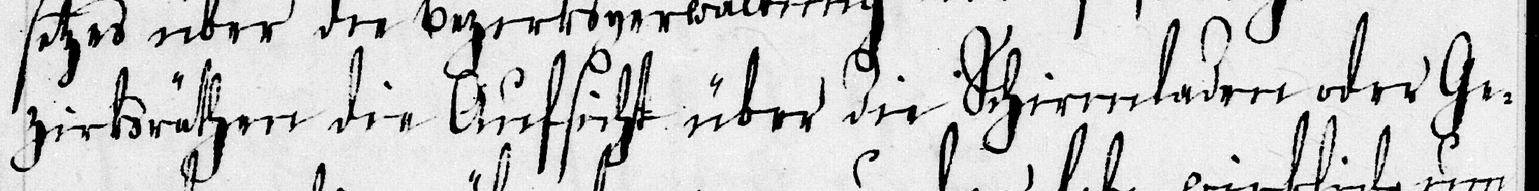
zirksräthen die Aufsicht über die Schirmladen oder Ge¬
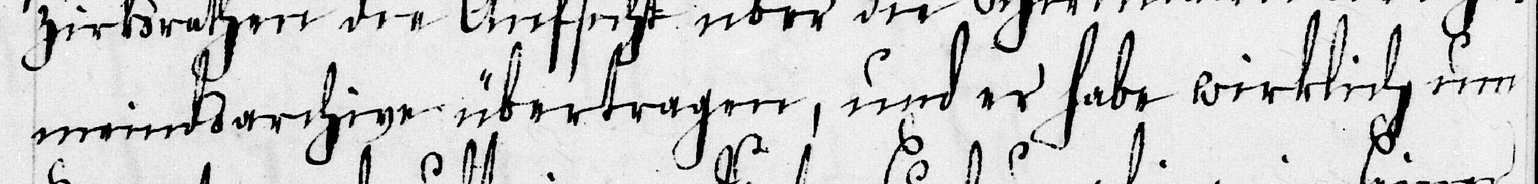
meindsarchive übertragen, und er habe wirklich um
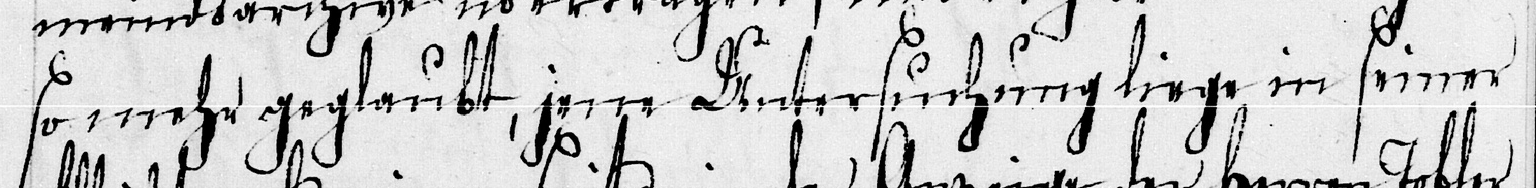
so mehr geglaubt, jene Untersuchung liege in seiner
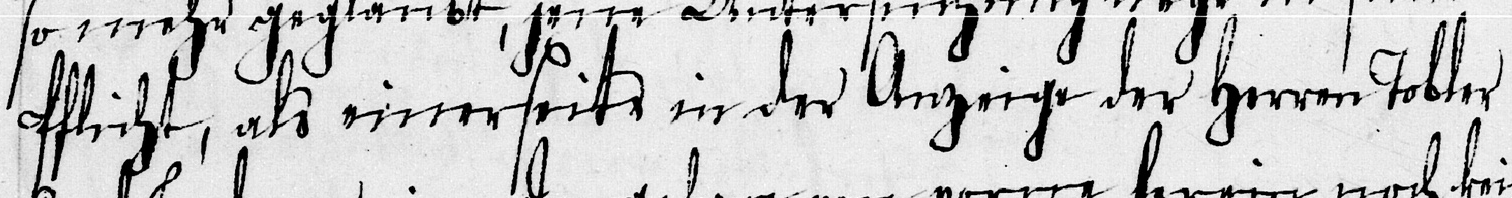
Pflicht, als einerseits in der Anzeige der Herren Tobler
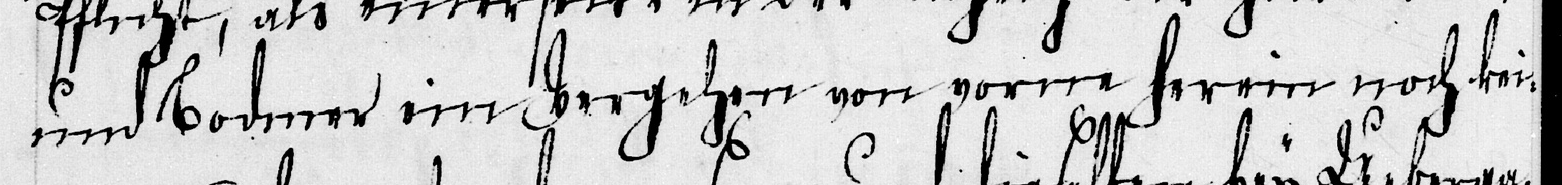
und Bodmer ein Vergehen von vorne herein noch kei¬
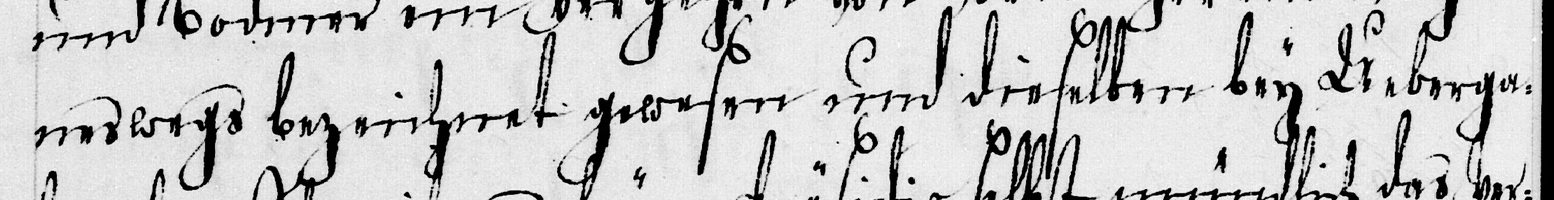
neswegs bezeichnet gewesen und dieselben bey Ueberga¬
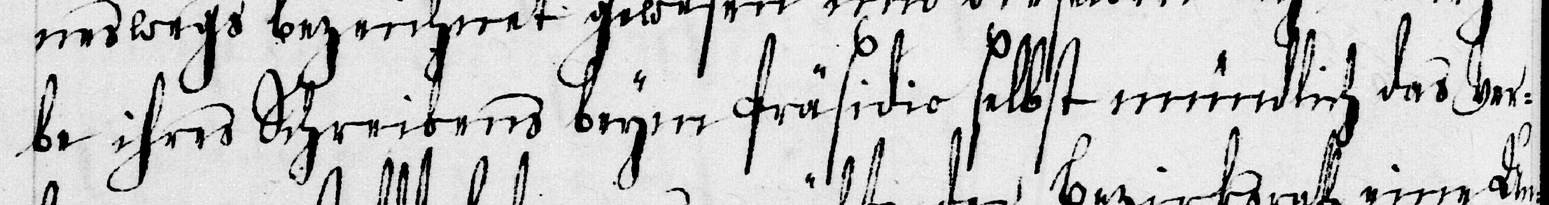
be ihres Schreibens beym Präsidio selbst mündlich das Ver¬
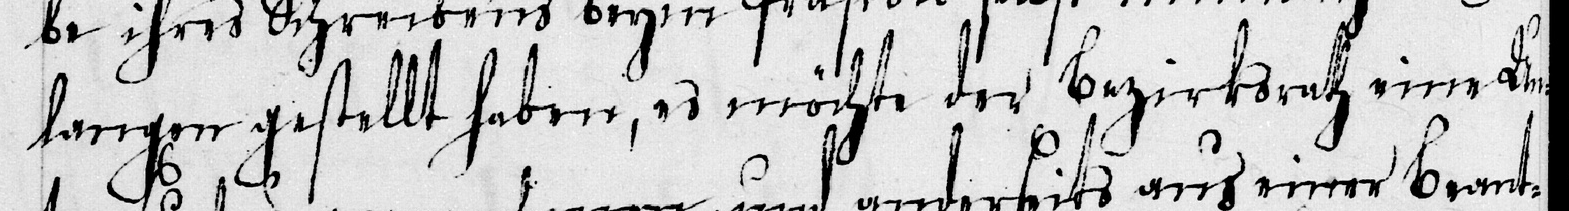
langen gestellt haben, es möchte der Bezirksrath eine Un¬
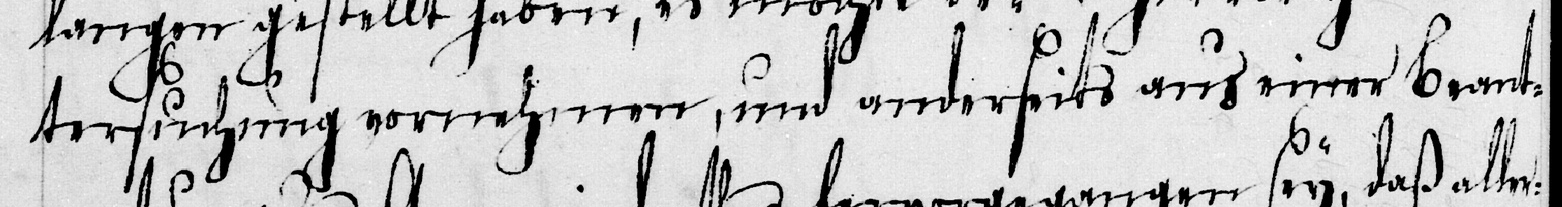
tersuchung vornehmen, und anderseits aus einer Beant¬
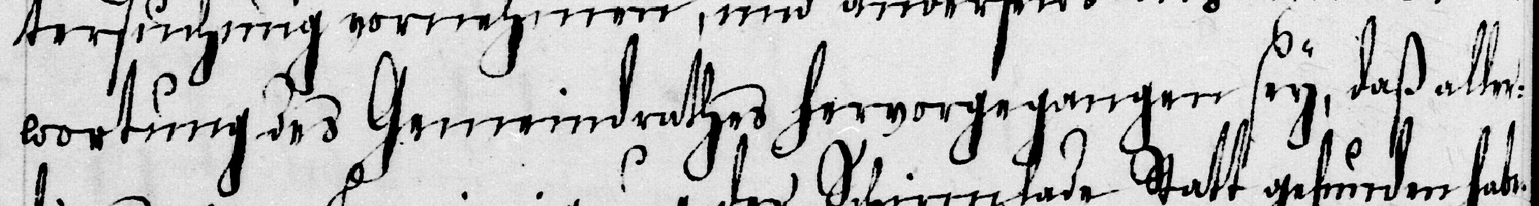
wortung des Gemeindrathes hervorgegangen sey, daß alle¬
